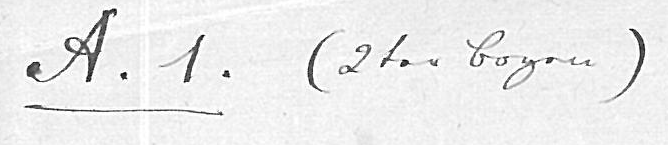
A. 1. (2ter Bogen)
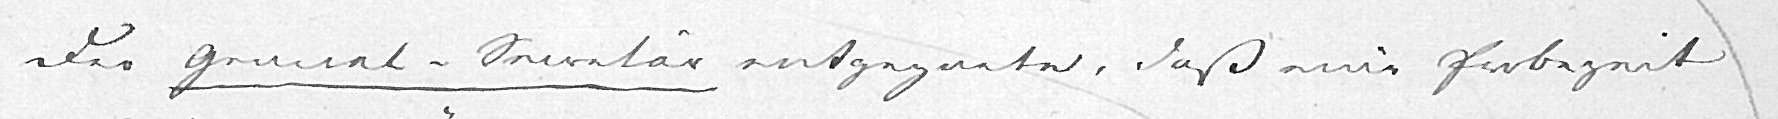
Der General-Secretär entgegnete, daß eine Probezeit
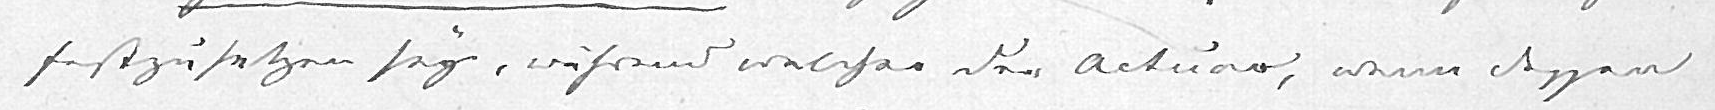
festzusetzen sey, während welcher der Actuar, wenn dessen
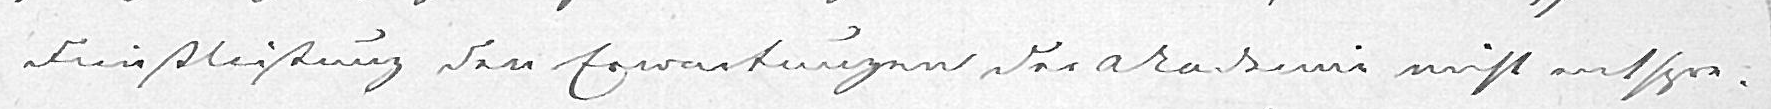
Dienstleistung den Erwartungen der Akademie nicht entspr-
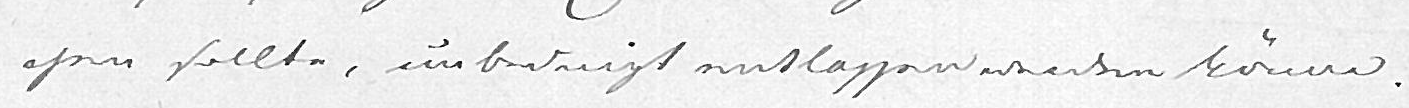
chen sollte, unbedingt entlassen werden könne.
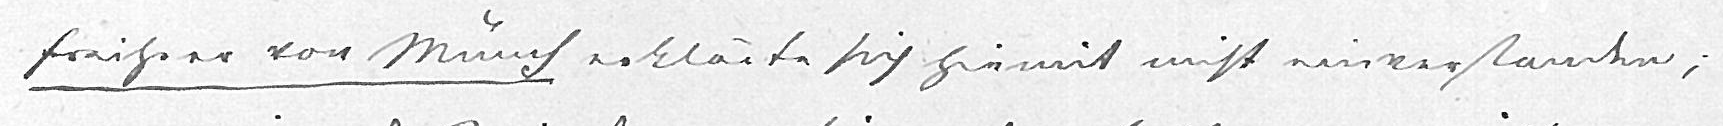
Freiherr von Münch erklärte sich hiemit nicht einverstanden;
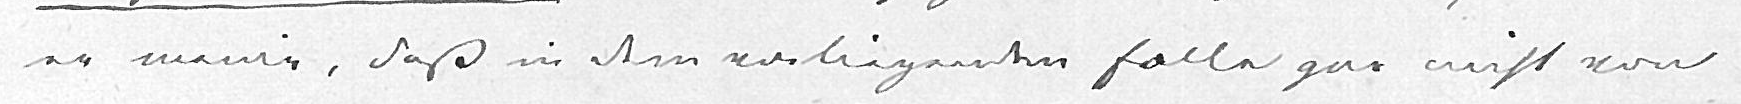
er meinte, daß in etwa vorliegendem Falle gar nicht von
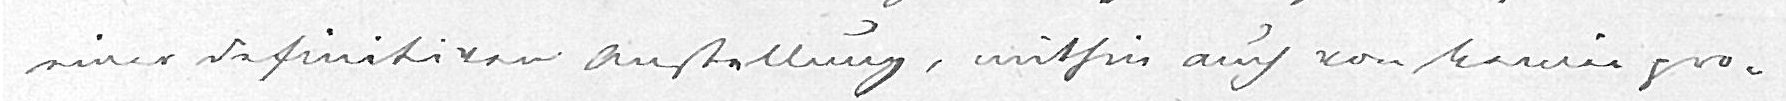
einer definitiven Anstellung, mithin auch von keiner pro-
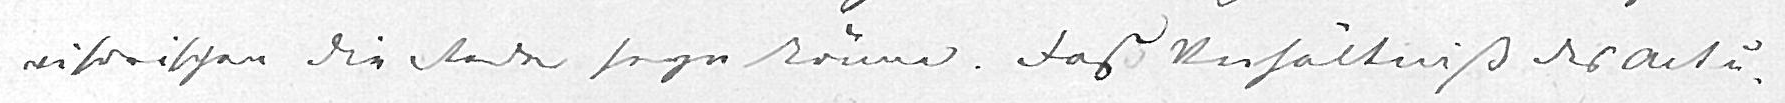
visorischen die Rede seyn könne. Das Verhältniß des Actu-
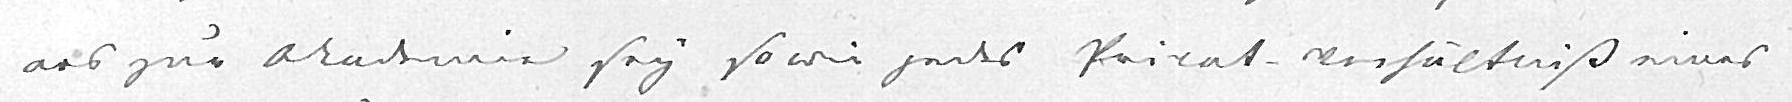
ars zur Akademie sey so wie jedes Privat Verhältniß eines
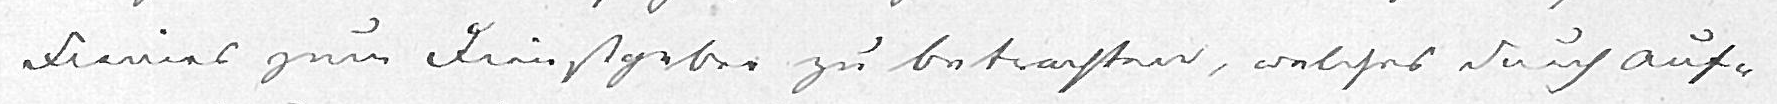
Dieners zum Dienstgeber zu betrachten, welches durch Auf-
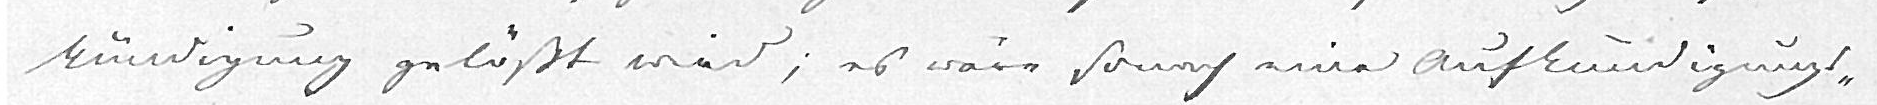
kündigung gelöst wird; es äwre sonach eine Aufkündigungs-
